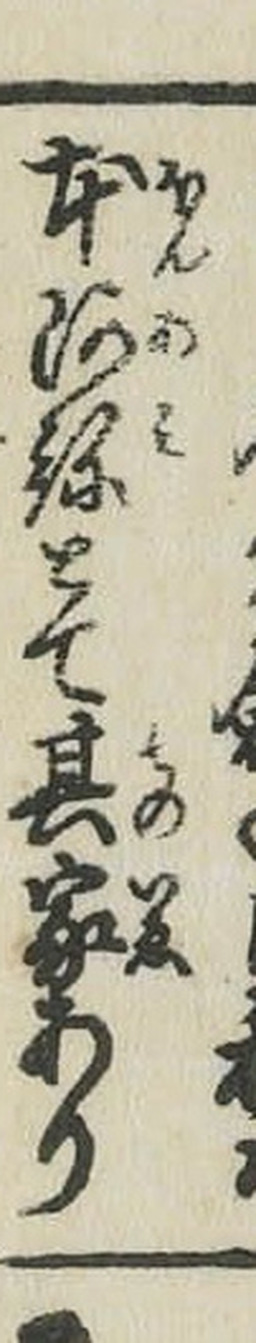本阿弥とて其家あり
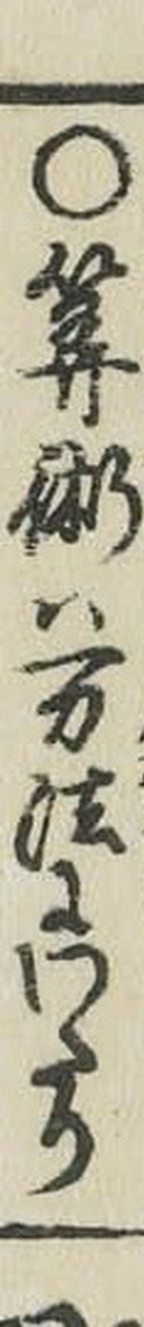○算術は万法にわたり
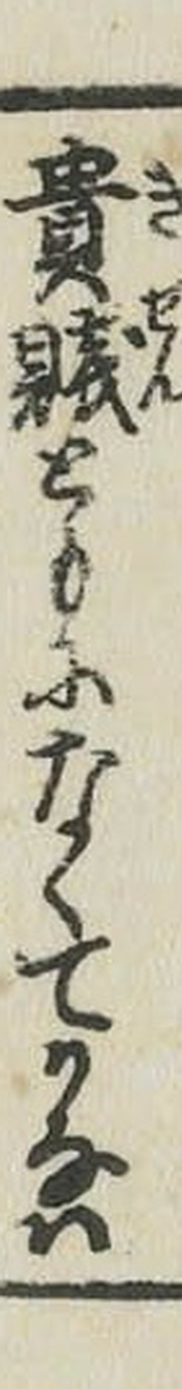貴賤ともになくてかなは
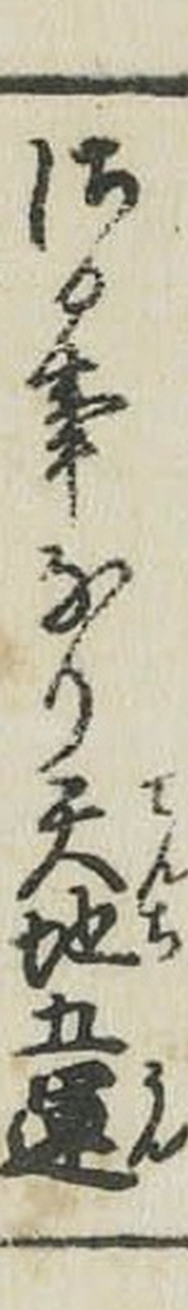さる事なり天地五運
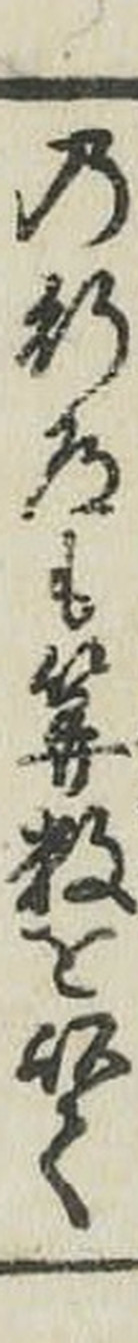の形道も算数を以て
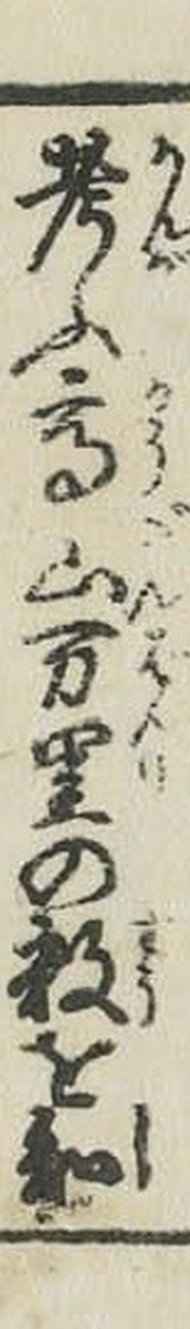考ふ高山万里の数を知
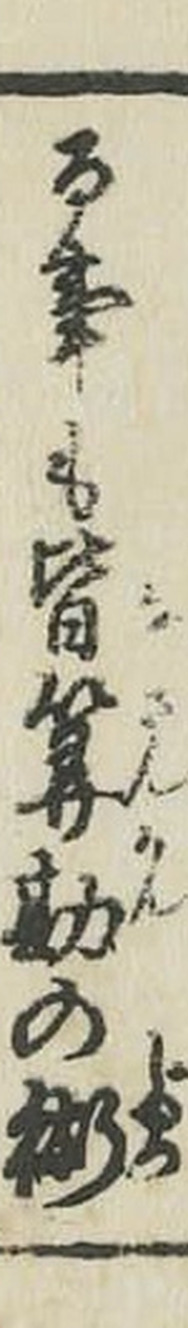る事も皆算勘の術
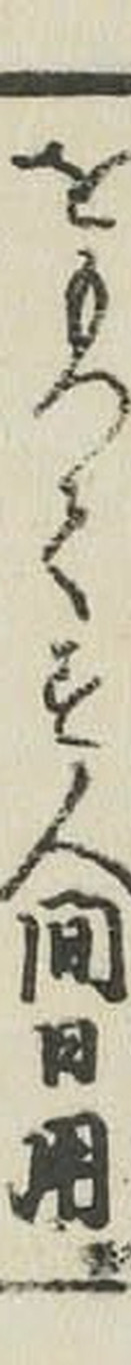をもつてす人間日用
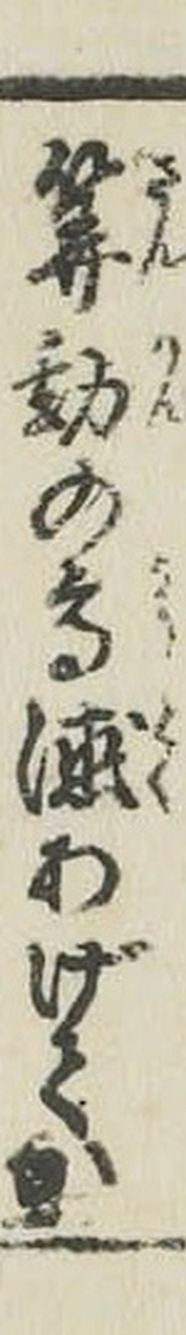算勘の高徳あげてか
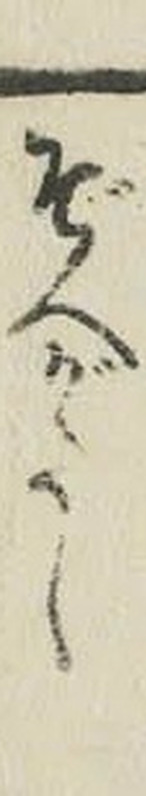ぞへがたし
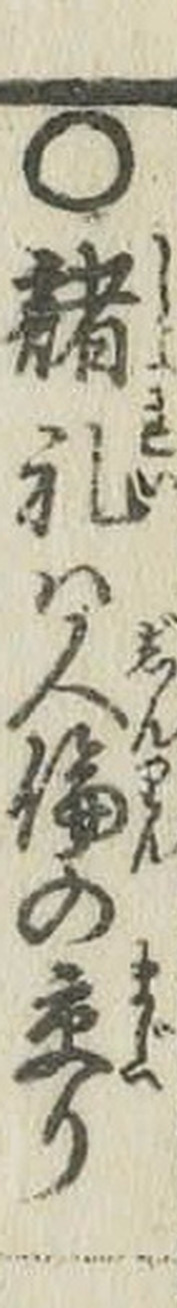○諸礼は人倫の交り
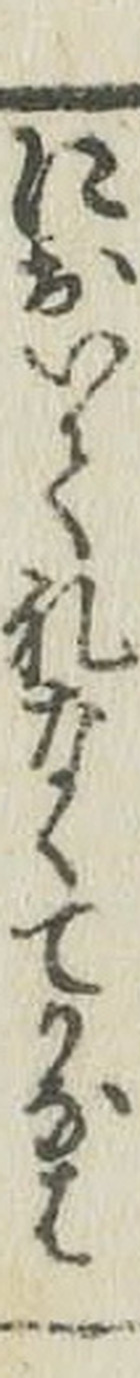において礼なくてかなは
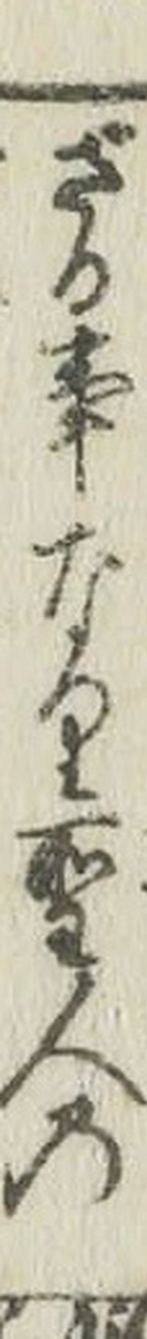ざる事なり聖人の
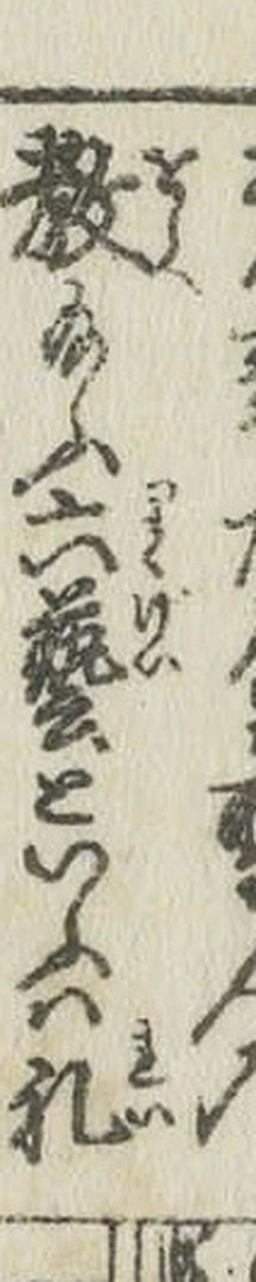教給ふ六芸といふは礼
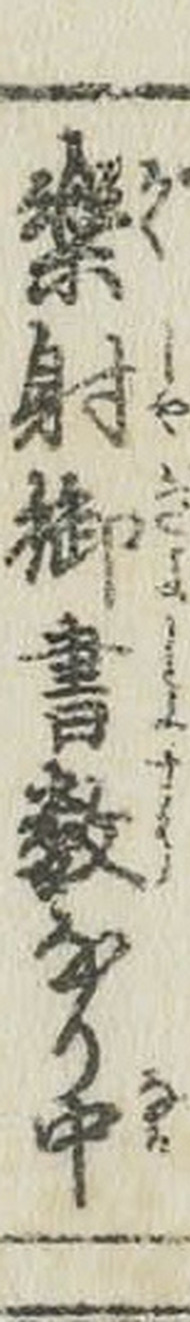楽射御書数なり中
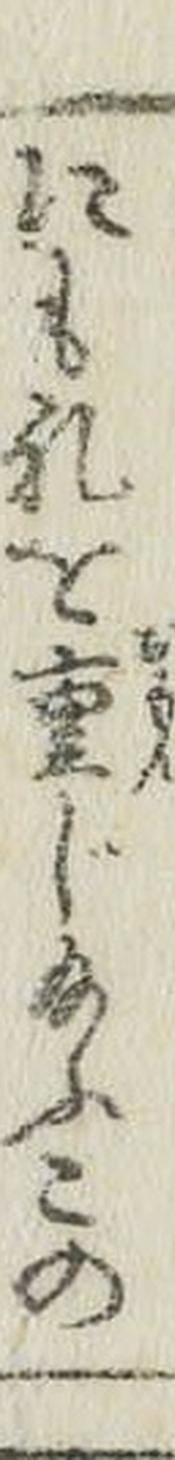にも礼を重じ給ふこの
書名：増補頭書訓蒙図彙大成 10巻 10:巻之21
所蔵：東京学芸大学教育コンテンツアーカイブ
